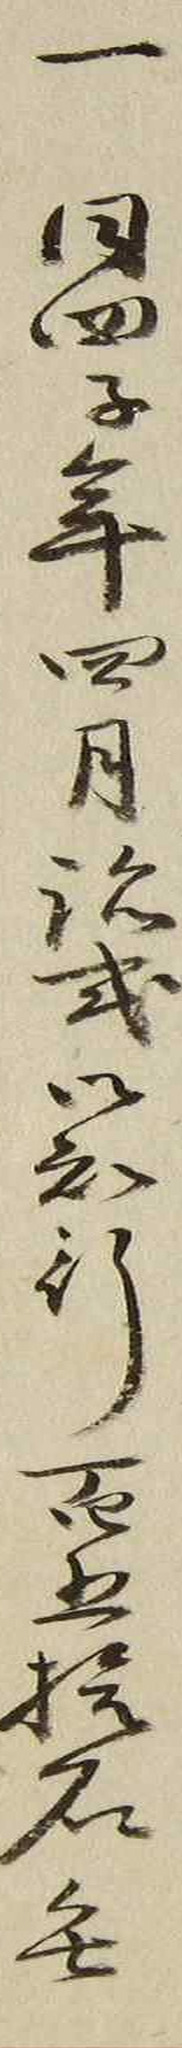一同四子年四月跡式御知行百五拾石無
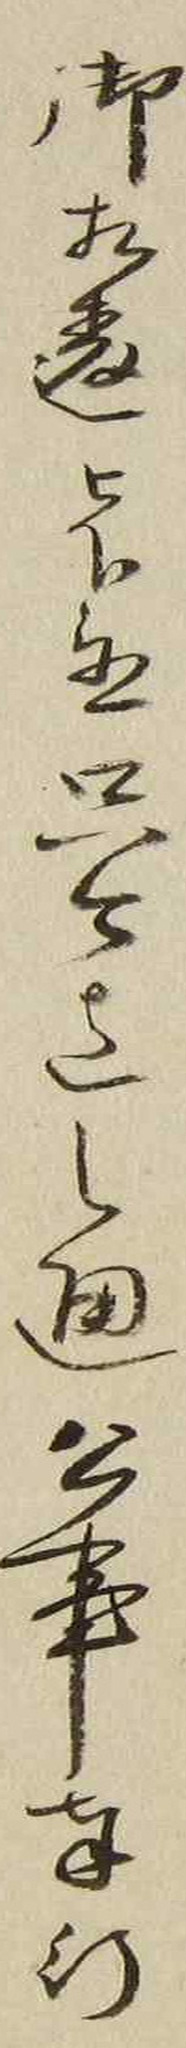御相違被下置只今迄之通公事奉行
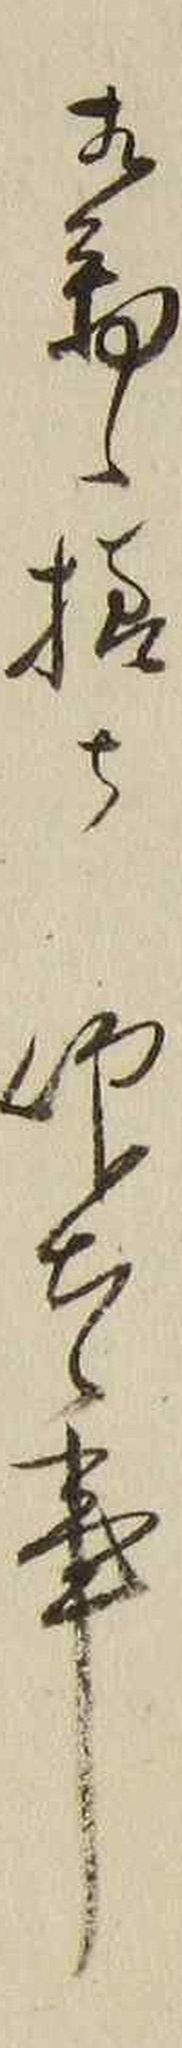相勤候様被仰出候事
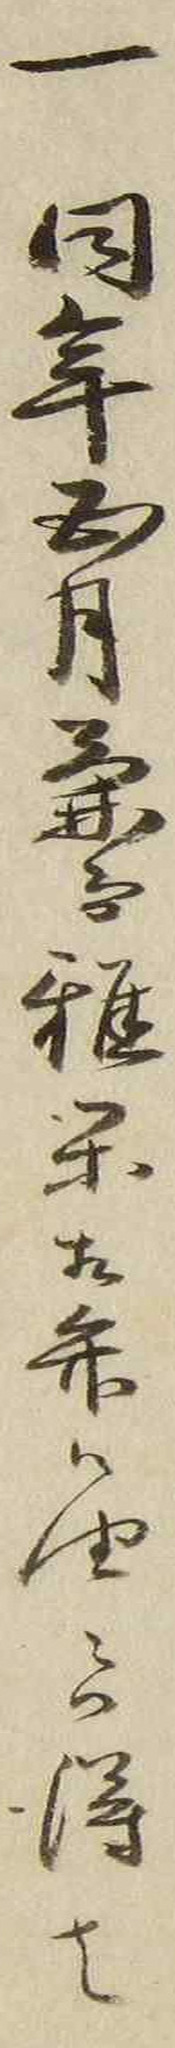一同年四子年五月兼而雅楽相弁候由ニ候得者

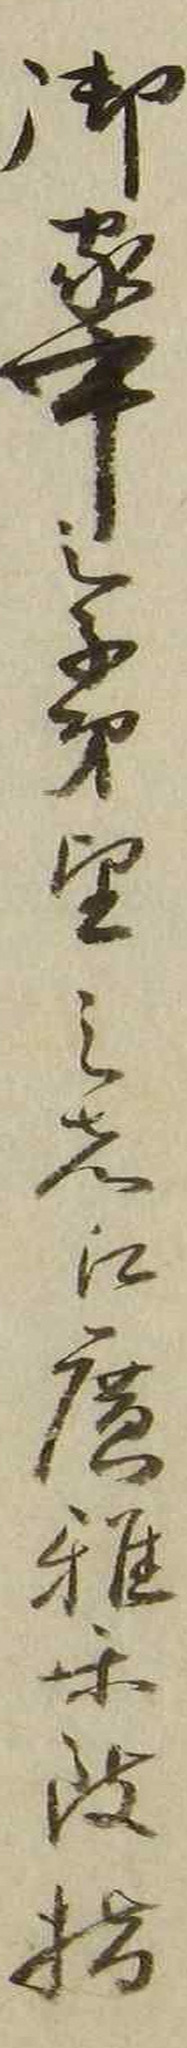御家中之子弟望之者江広雅楽致指
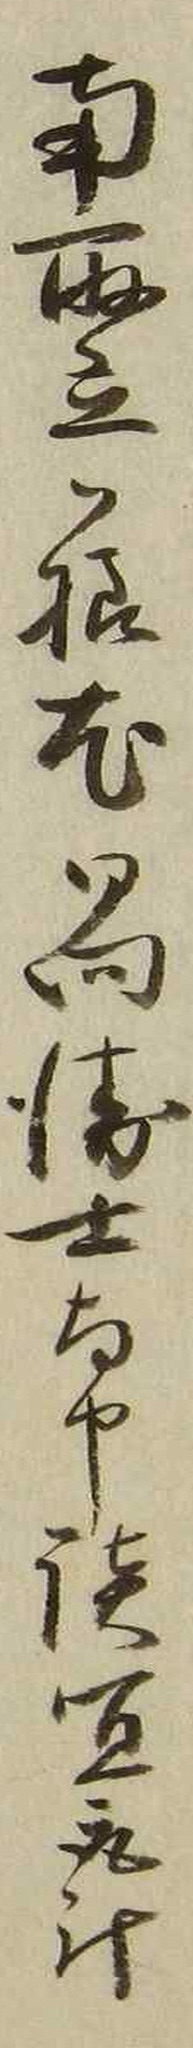南取立候様尤日向衛士与申談宜取斗
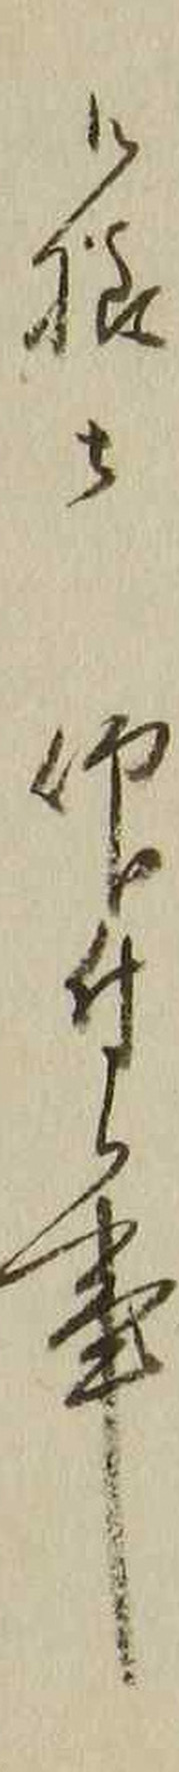候様被仰付候事
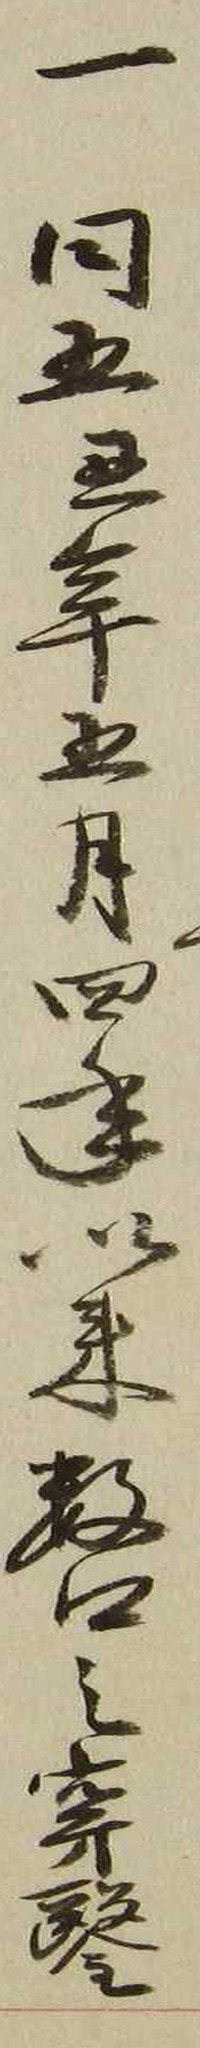一同五丑年五月四年以来数口之穿鑿
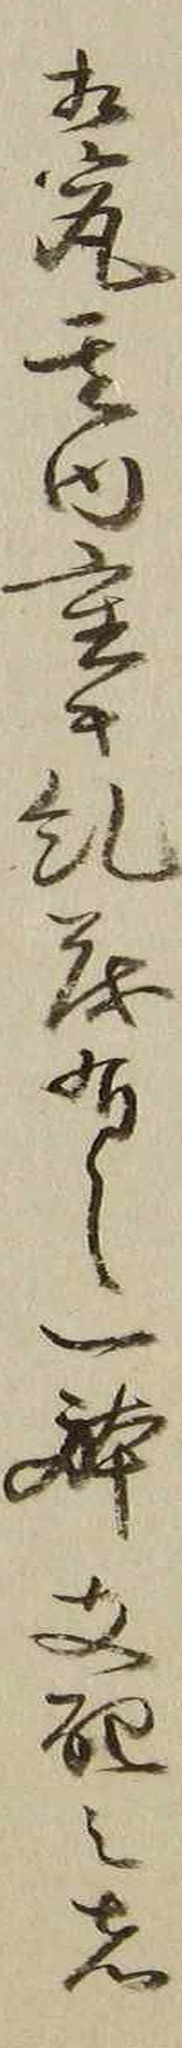相究其内重キ糺茂有之一躰支配之者
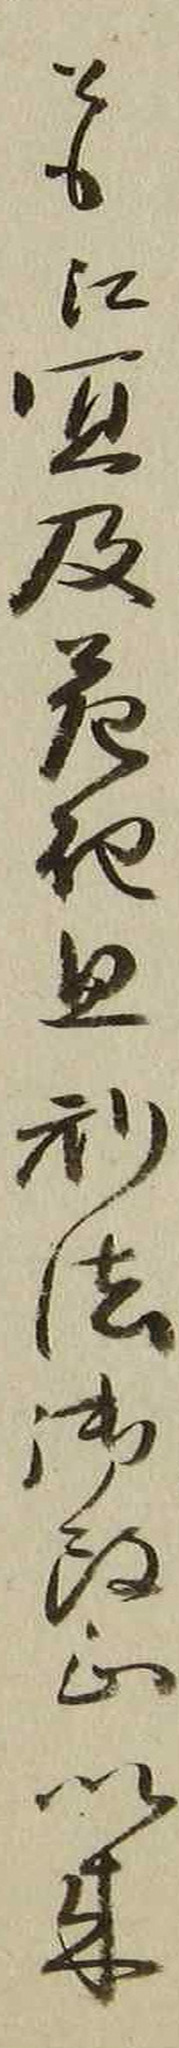とも江宜及差配且利法御改正以来
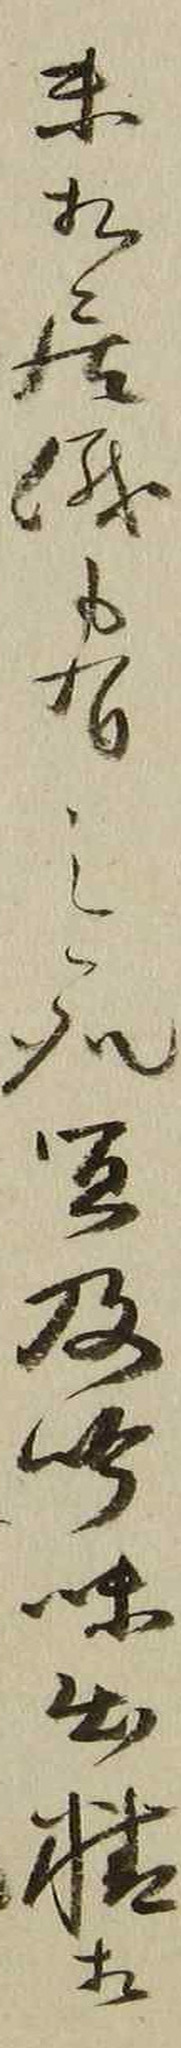未相居儀も有之候処宜及吟味出精相
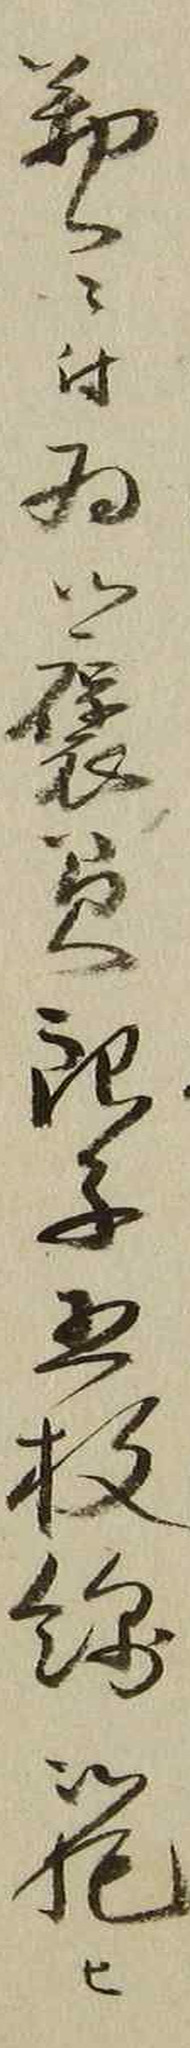勤候ニ付為御褒美銀子五枚綿弐把被
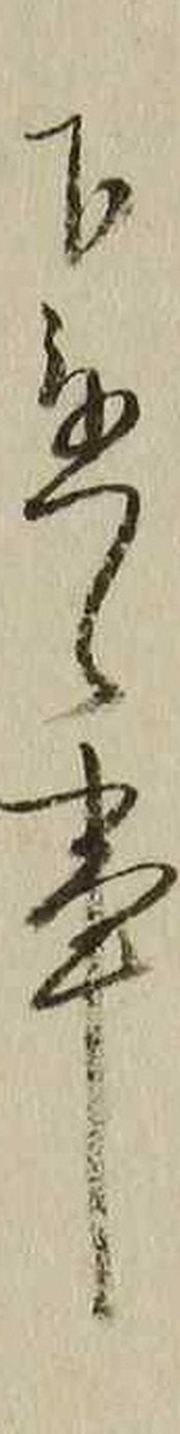下置候事
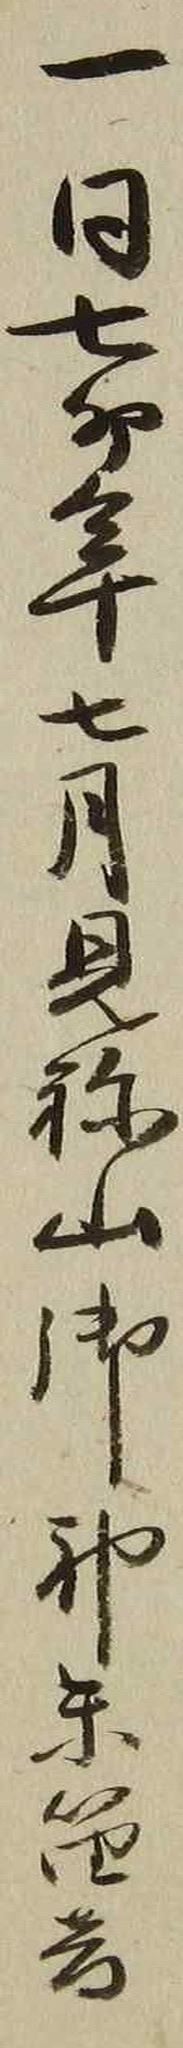一同七卯年七月見祢山御神楽笛音
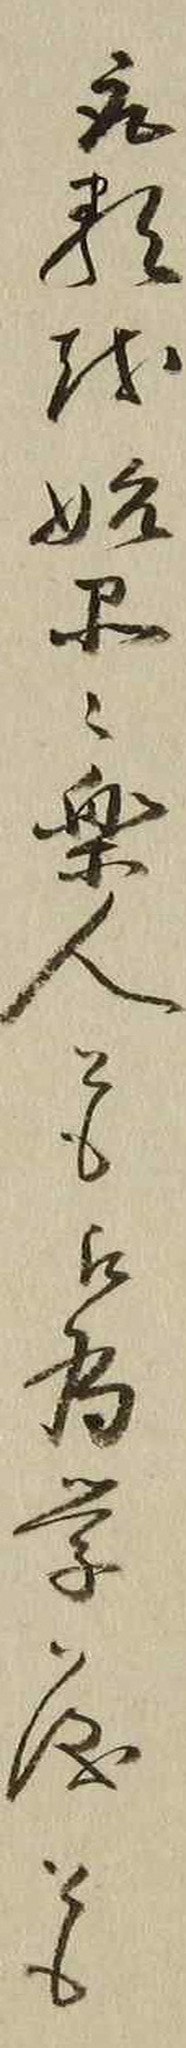取類を始品々楽人とも江為学候儀とも
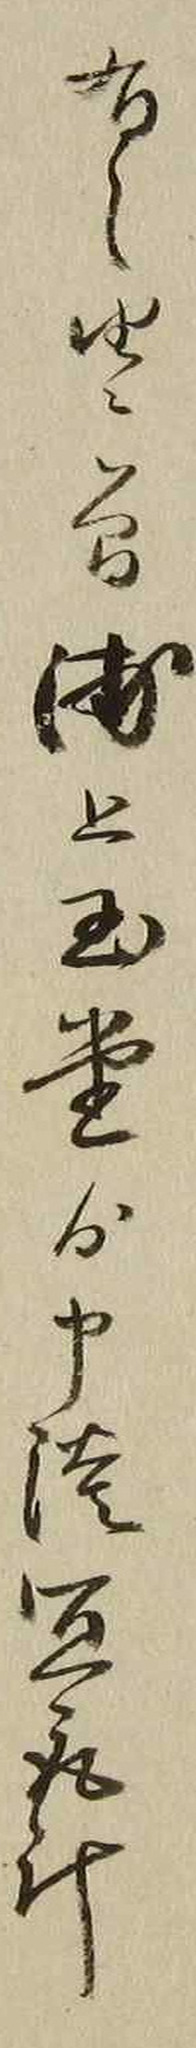有之由ニ候間浦上玉堂より申談宜取斗
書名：諸士系譜　巻之261　あ之部14
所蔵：会津若松市立会津図書館
